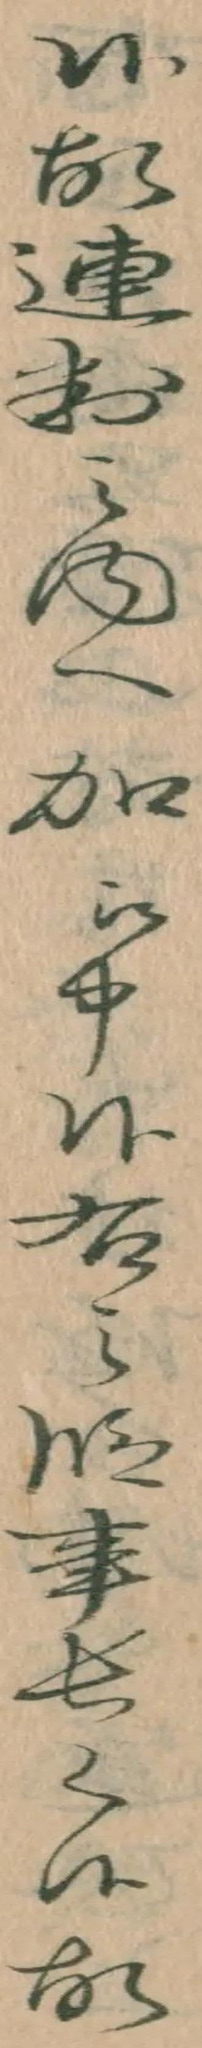候故連判之内へ加被申候有之段事長く候故
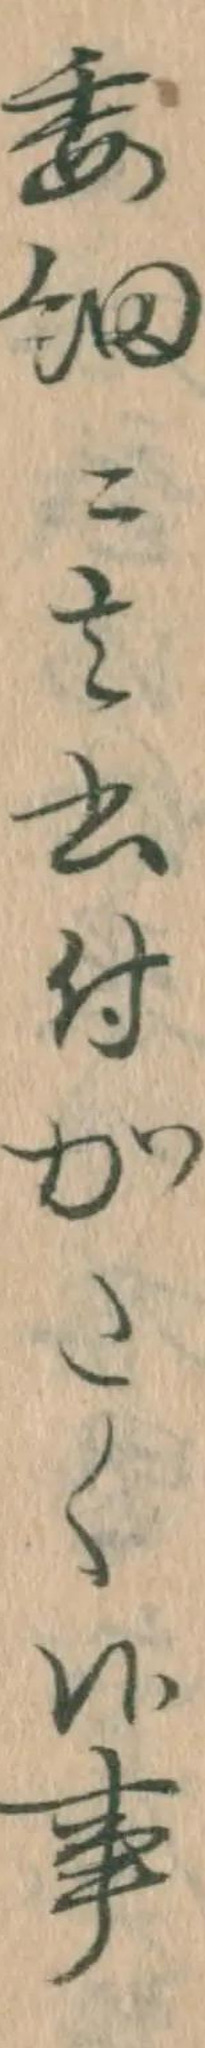委細に者云付加たく候事
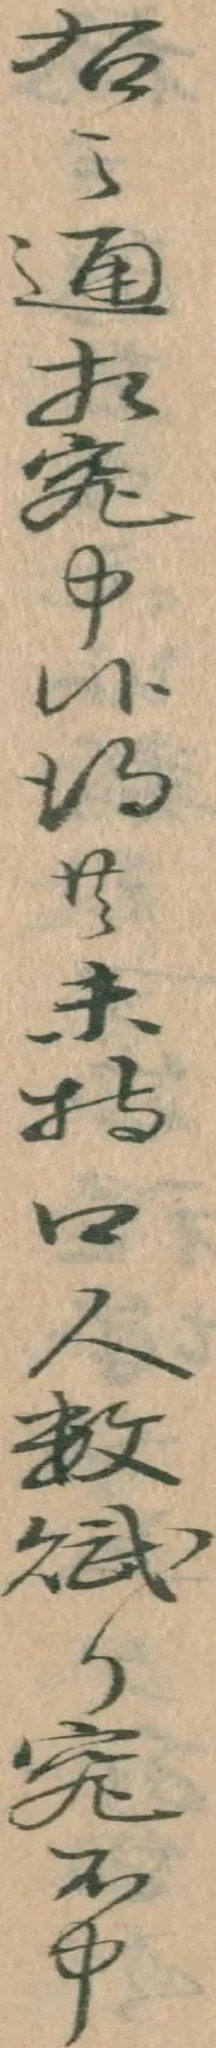右之通相究申候得共未持口人数賦り究不申
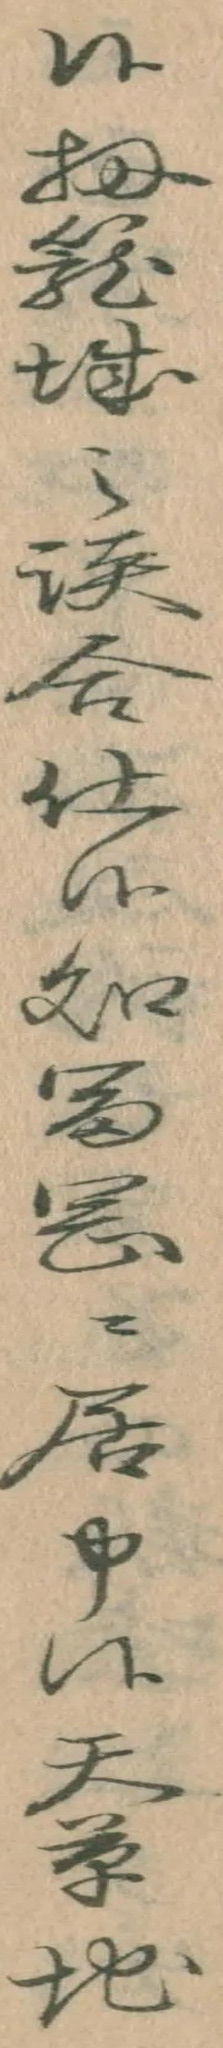候扨籠城之談合仕候処冨岡に居申候天草地
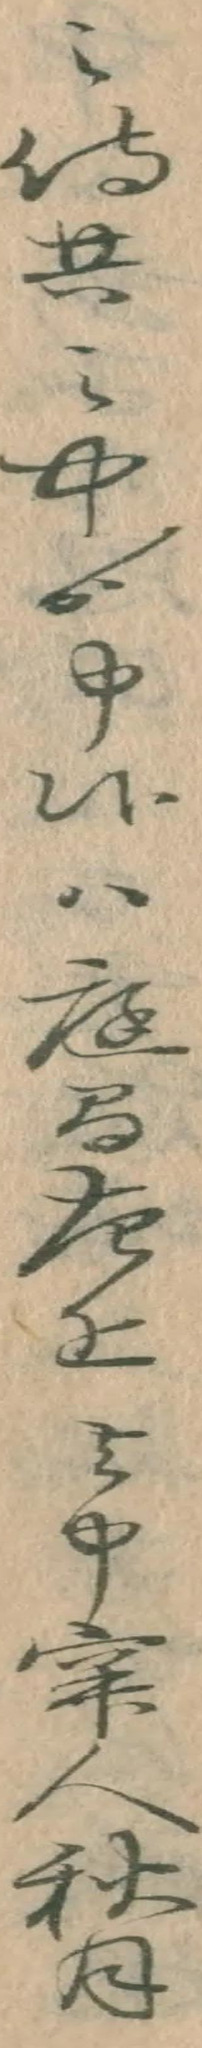之侍共之中ゟ申候は庭間左近与申牢人秋月
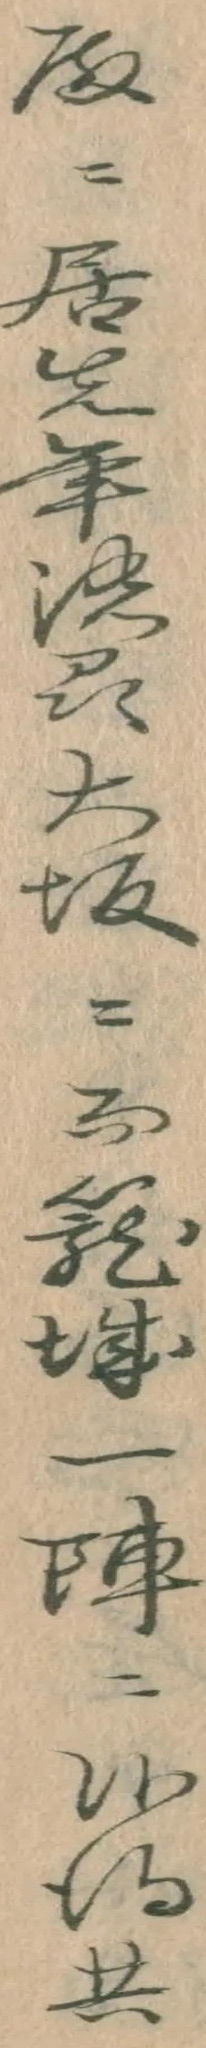殿に居先年濃州大坂に而籠城一陣に候得共
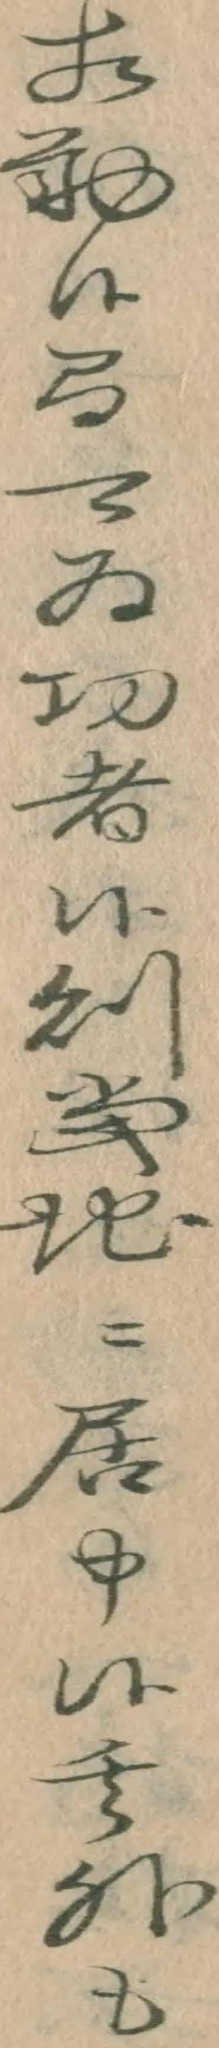相勤候間可ゐ功者候則当地に居申候其外も
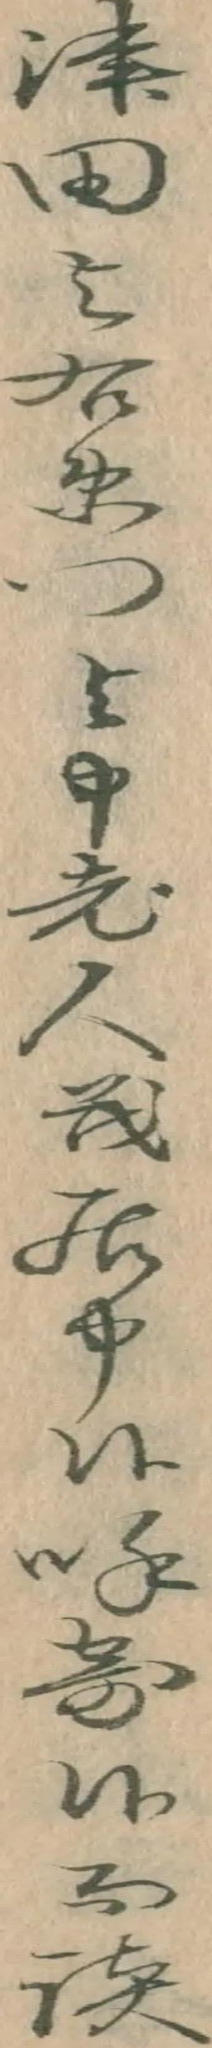津田与右衛門与申老人茂居申候呼寄候而談
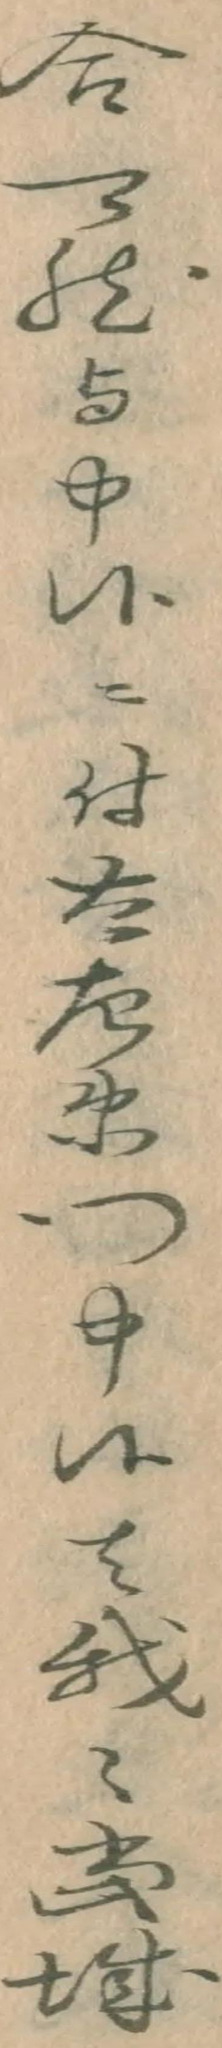合可然与申候に付太左衛門申候者我々当城

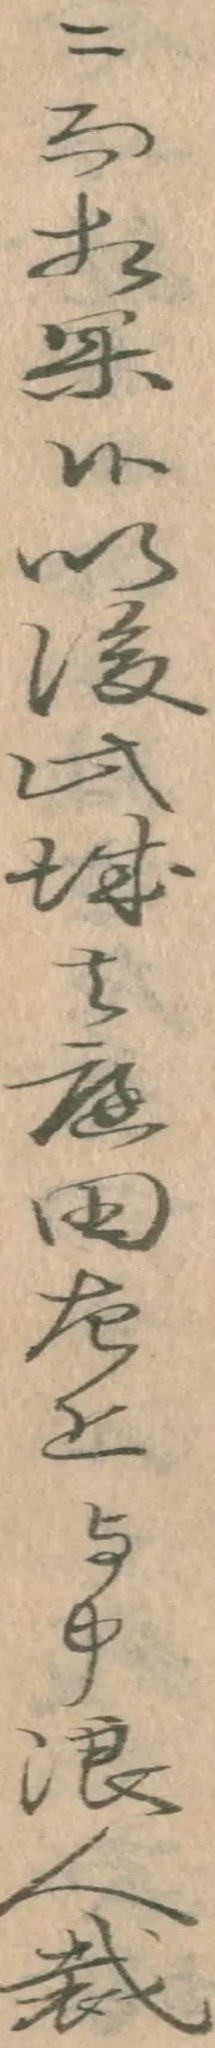に而相果候以後此城者庭田左近与申浪人裁
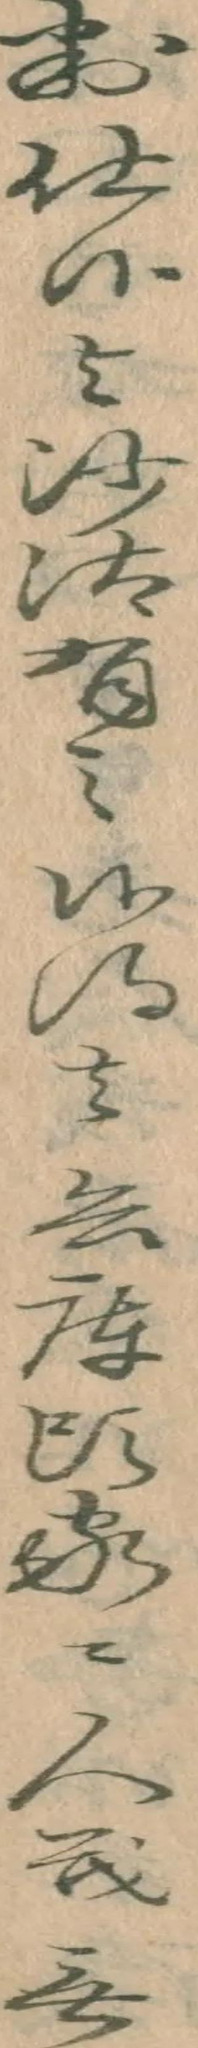判仕候与沙汰有之候得者兵庫頭家に人茂無
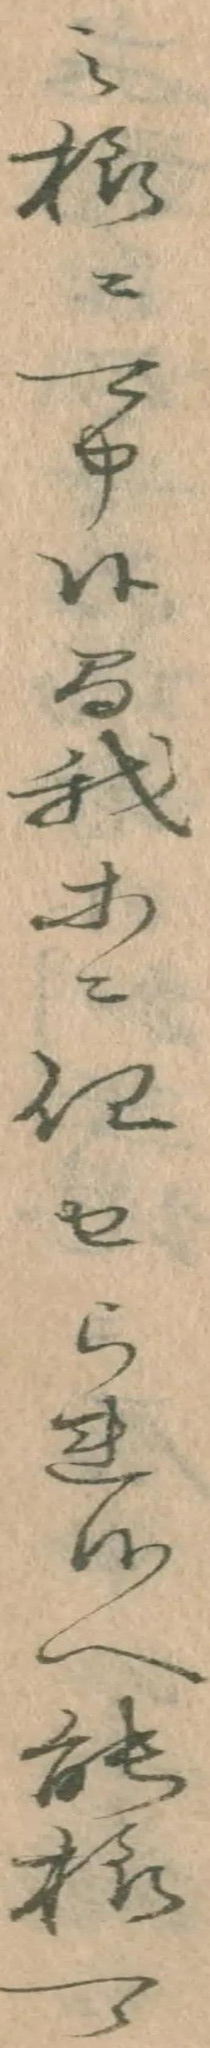之様に可申候間我等に任せら連候へ能様可
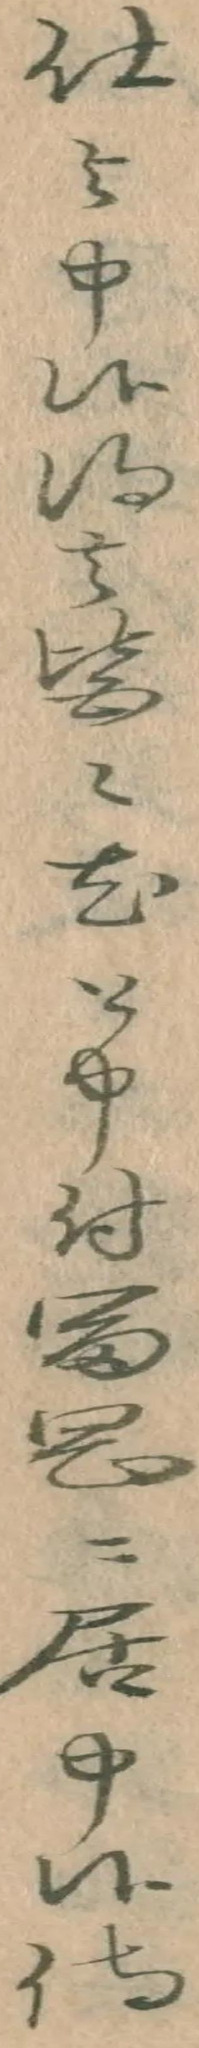仕与申候得者皆々尤と申付冨岡に居申候侍
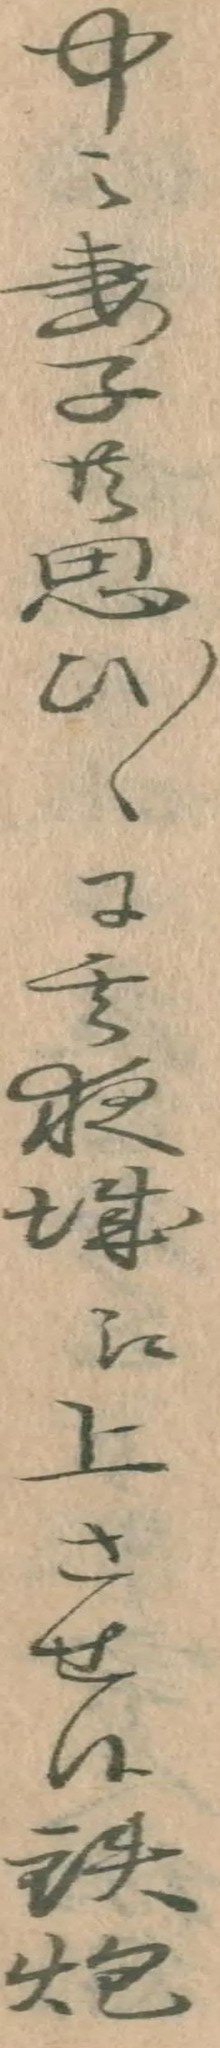中之妻子共思ひ〱尓其夜城江上させ候鉄砲
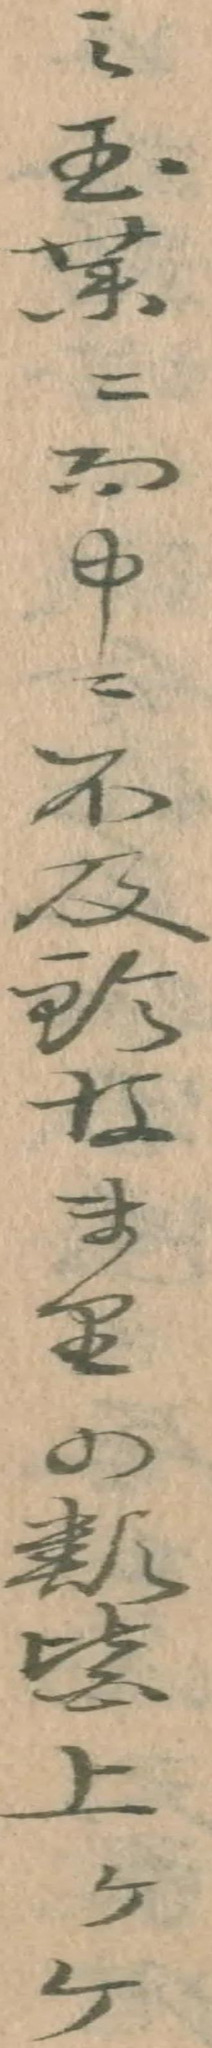之玉薬に而申に不及鈴なま里の類皆上けけ
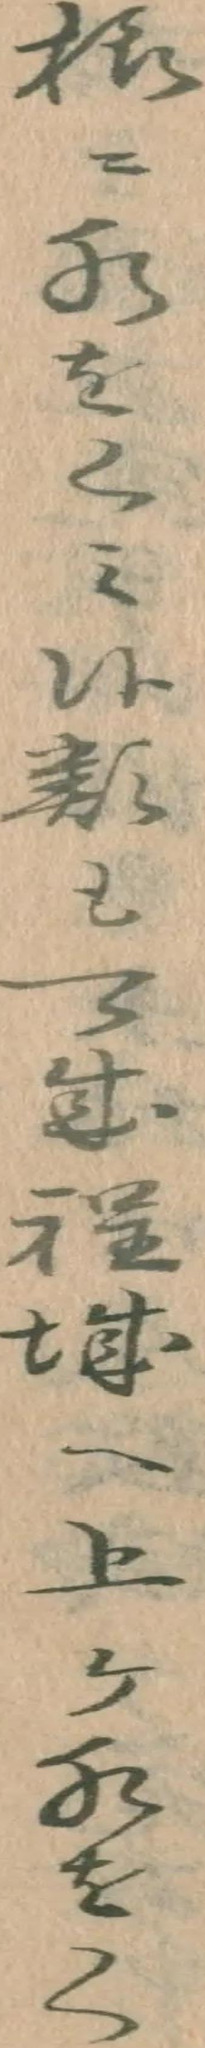様に水をくみ候類も可成程城へ上け水をく
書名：切支丹御退治記 49巻. [2]
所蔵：国立国会図書館 National Diet Library, JAPAN
